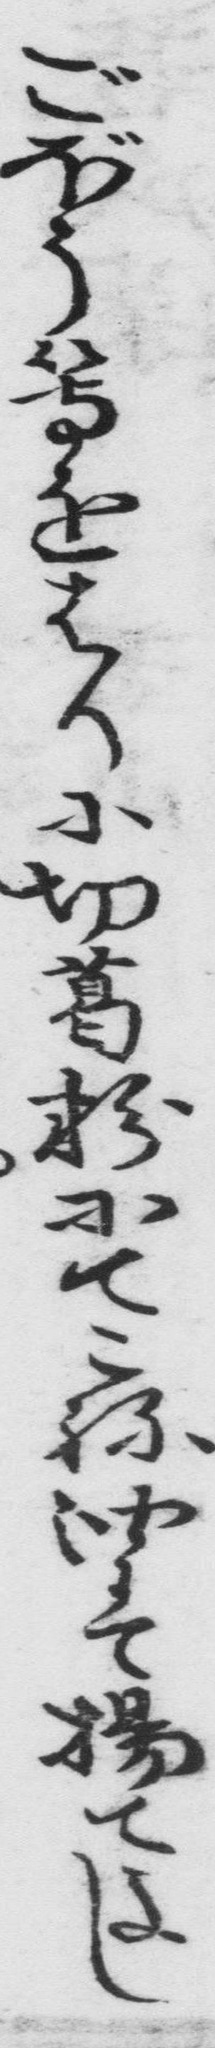ごぼう等をはり尓切葛粉尓てこ祢油尓て揚てよし
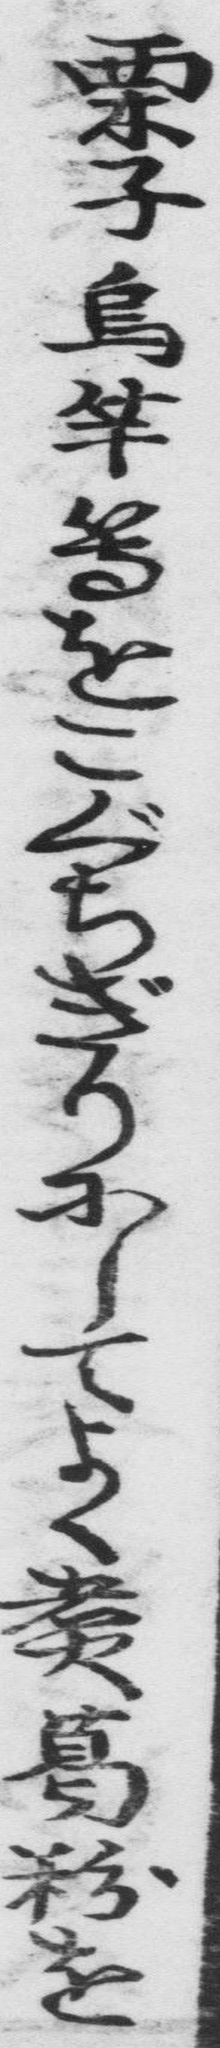栗子烏芋等をこぐちぎり尓してよく煮葛粉を
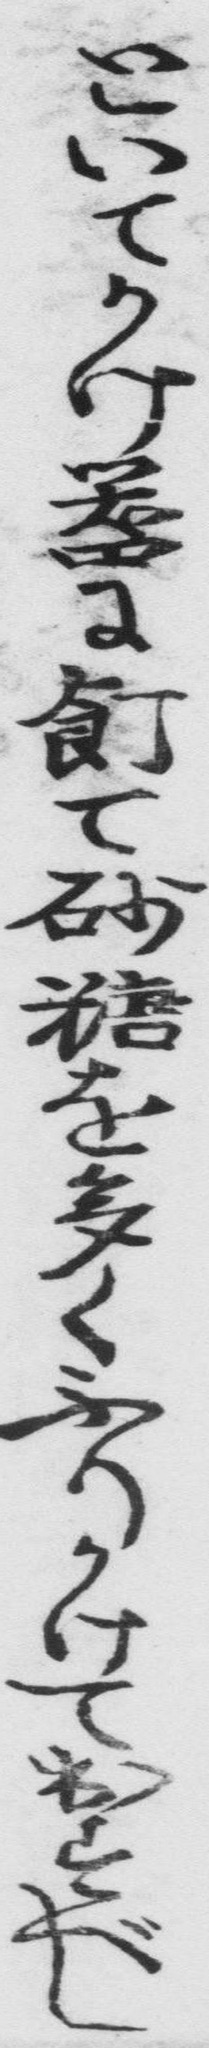といてかけ器尓飣て砂糖を多くふりかけて出春べし
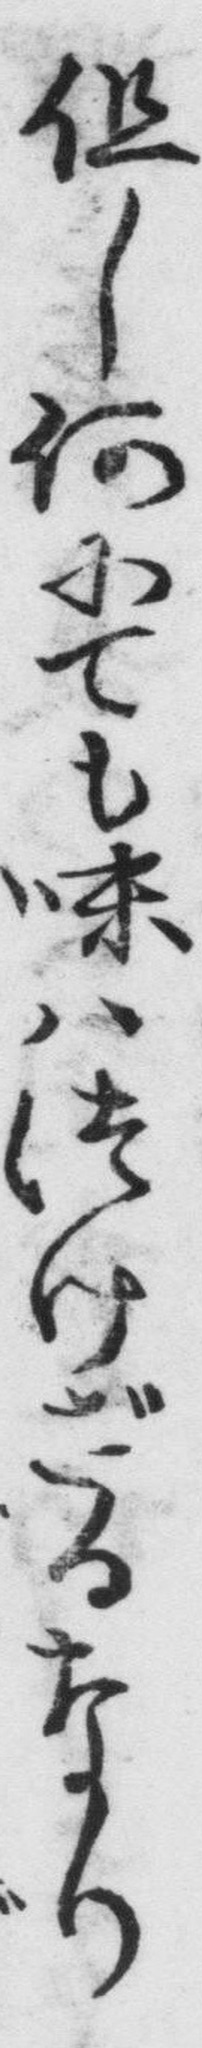但し何尓ても味は徒けざるなり
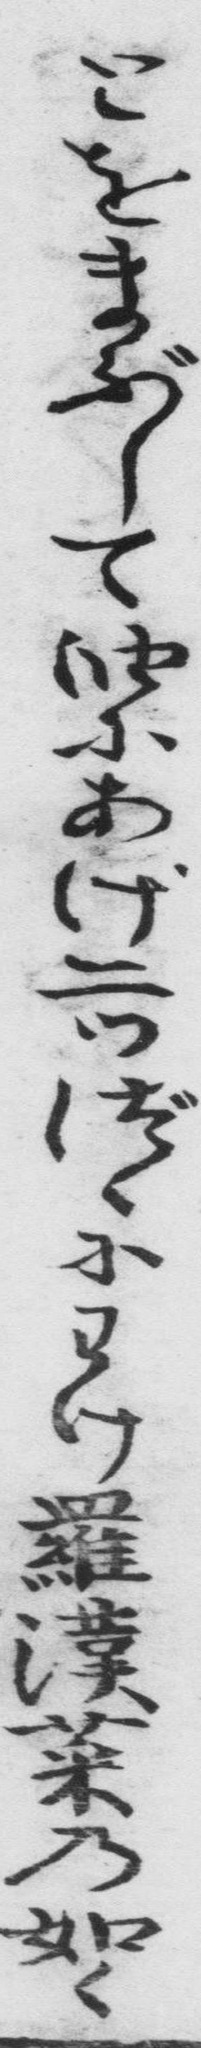とをまぶして油尓あげ二ツ徒々尓わけ羅漢菜乃如く
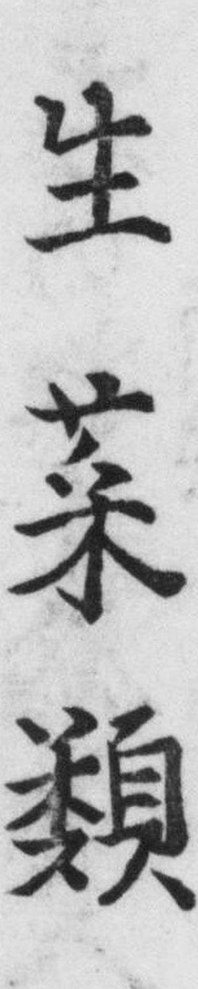生菜類
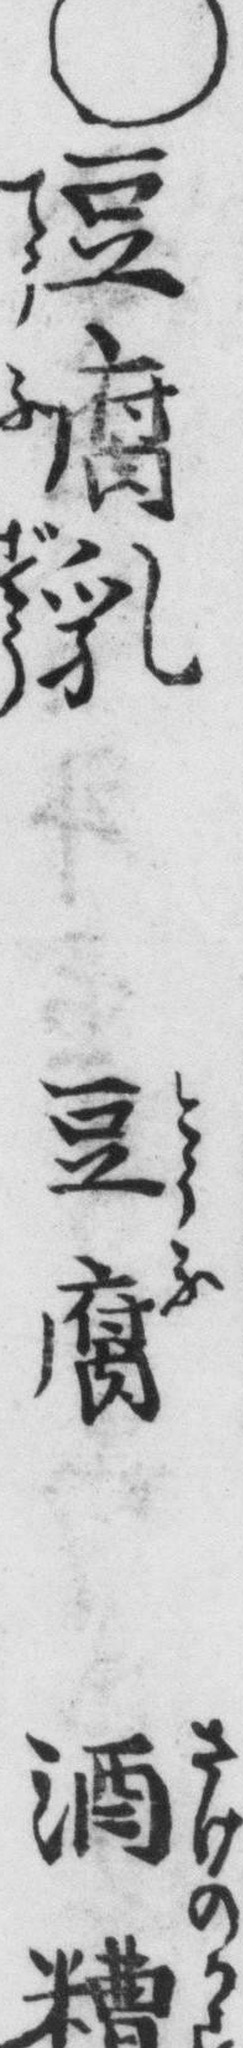〇豆腐乳豆腐酒糟
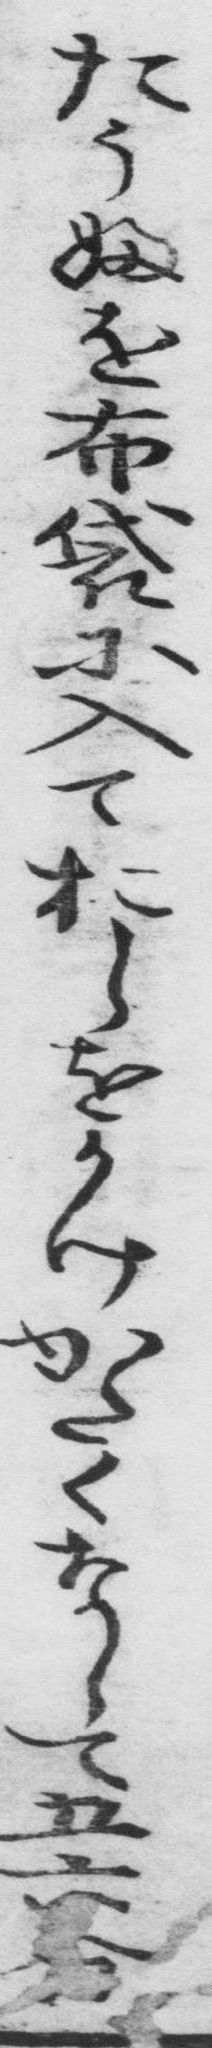たう婦を布袋尓入て於しをかけかたくなりて五六分

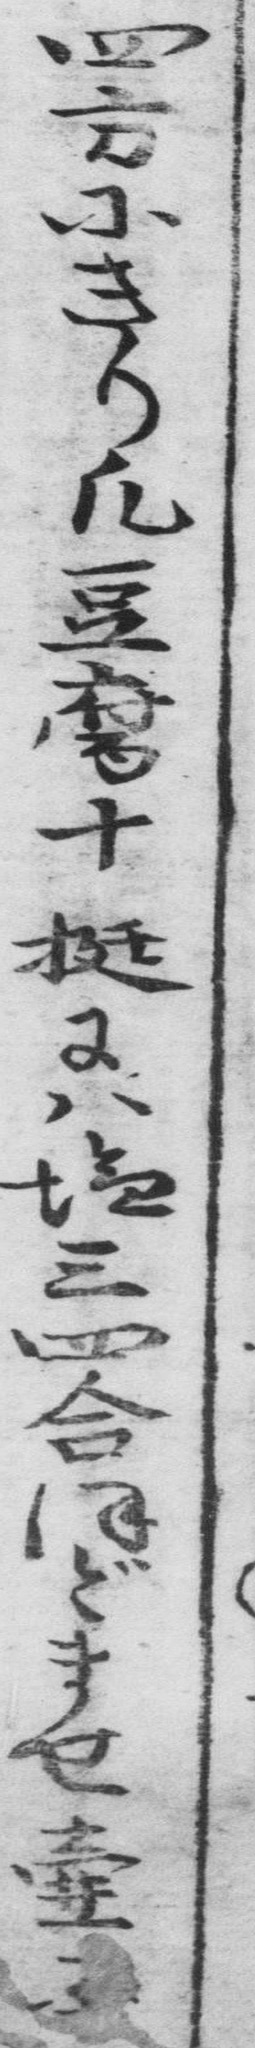四方尓きり凡豆腐十挺尓は塩三四合ほどませ壺尓
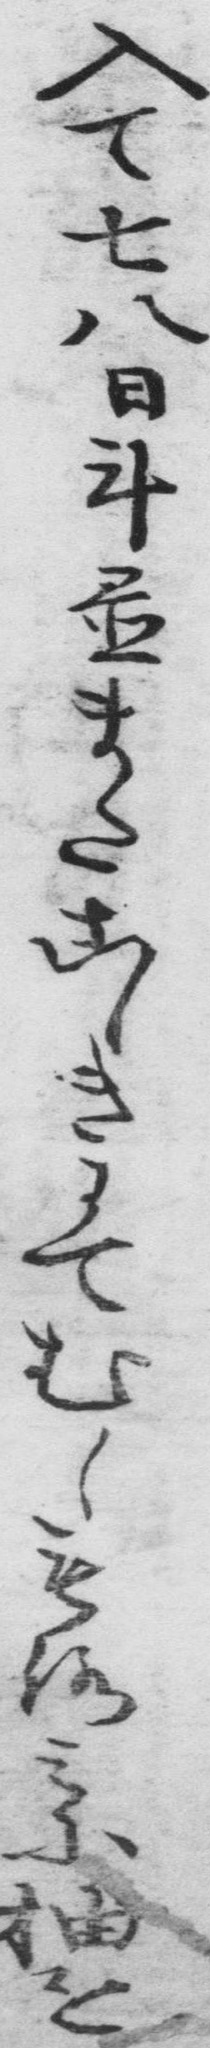入て七八日斗置また古しき尓てむしも路み尓柚を
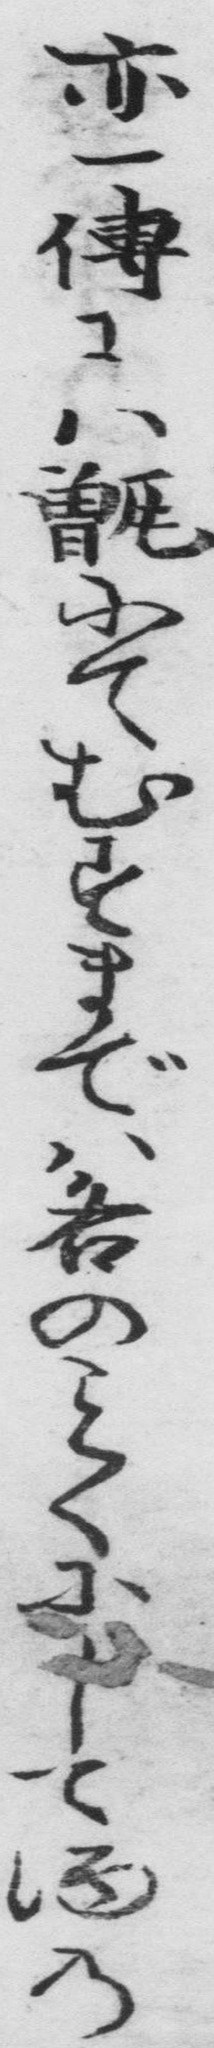亦一傳尓は甑尓てむ春までは各のことく尓して酒乃
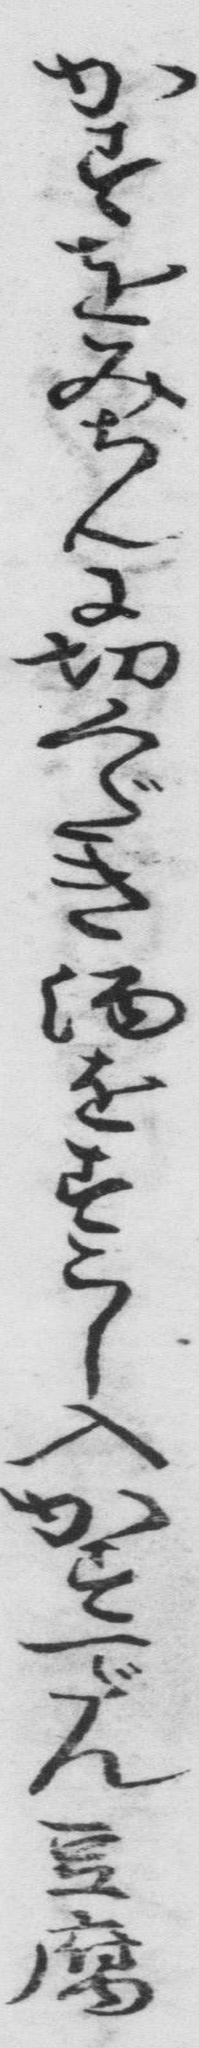か春をみちん尓切くだき酒を春こし入か春一だん豆腐
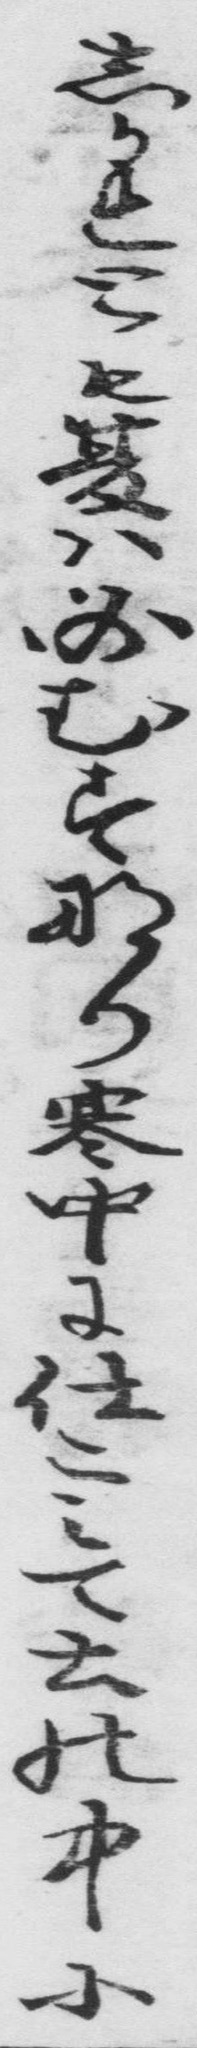志か連とも夏は必む春那り寒中尓仕こみて土能中尓
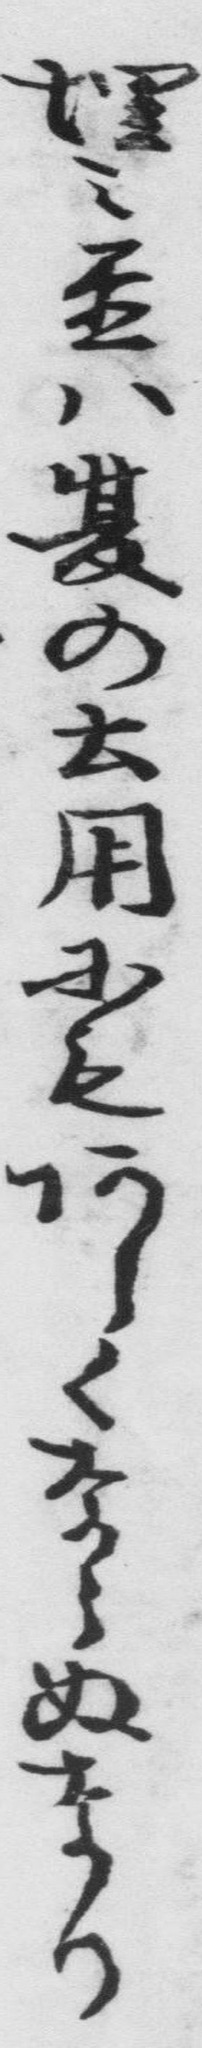埋み置は夏の土用尓も阿しくならぬなり
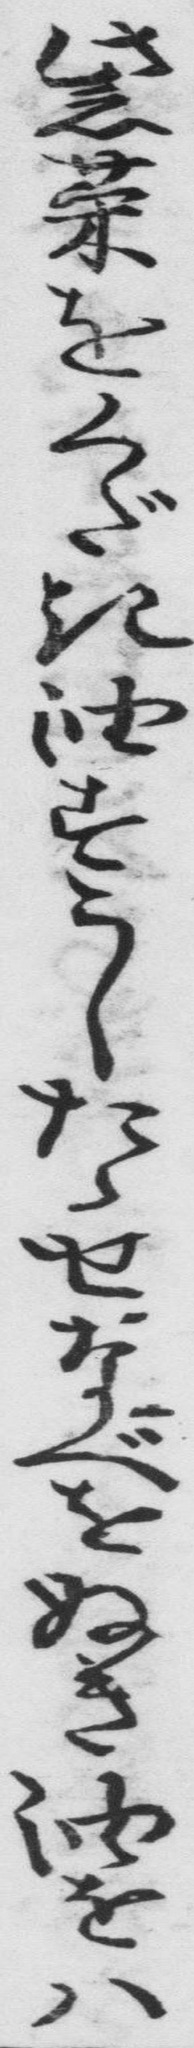紫菜をくだ起油春こしたらせなべをぬき油をは
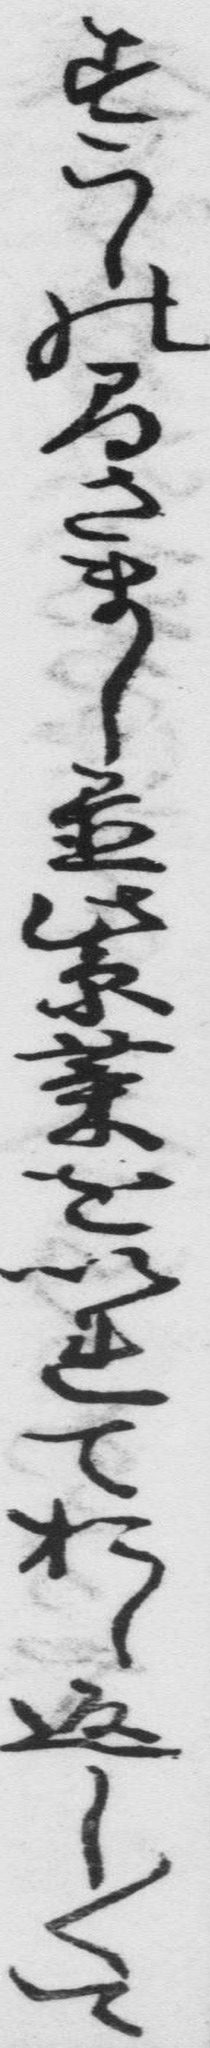春こし能間さまし置紫菜を以連て於し返し〳〵て
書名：普茶料理抄
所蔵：大阪府立大学学術情報センター 国文学研究資料館
